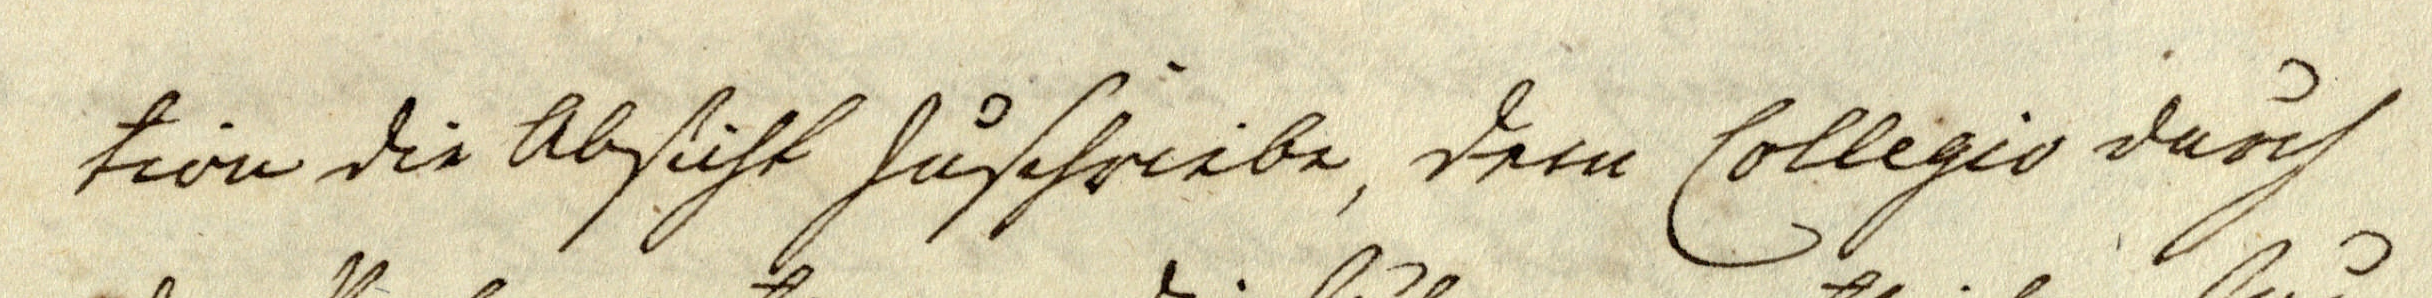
tion die Absicht zuschriebe, dem Collegio durch
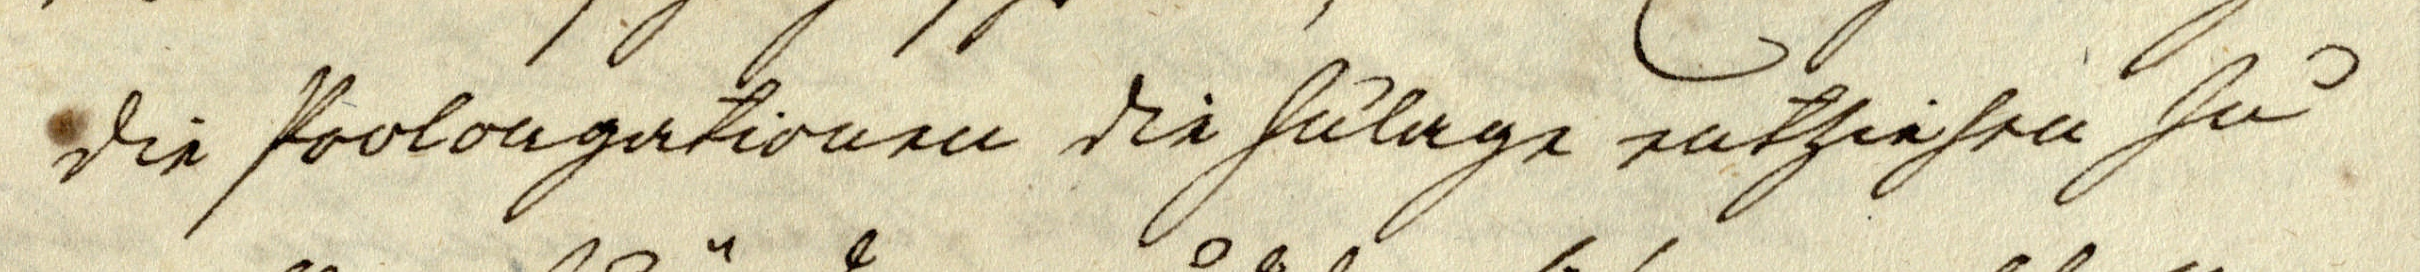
die Prolongationen die Zulage entziehen zu
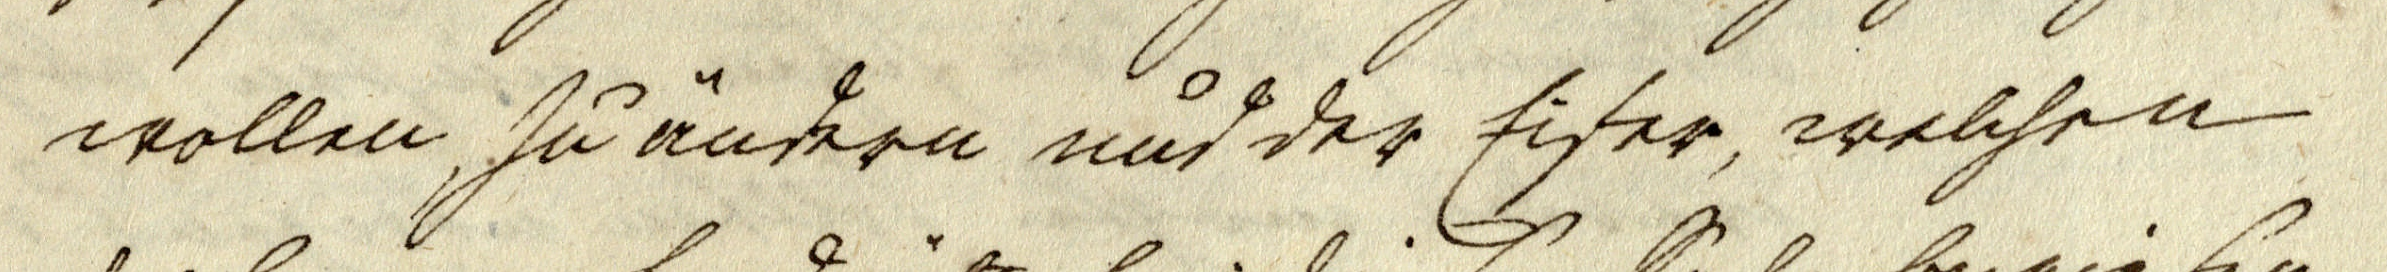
wollen, zu ändern und der Eifer, welchen
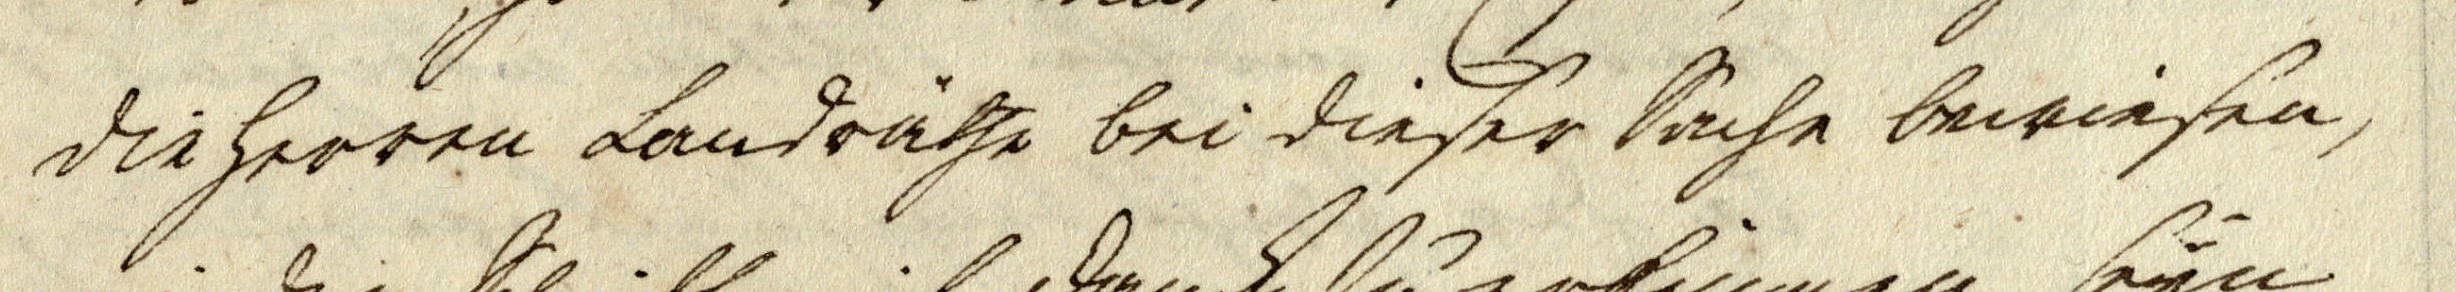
die Herren Landräthe bei dieser Sache bewiesen,
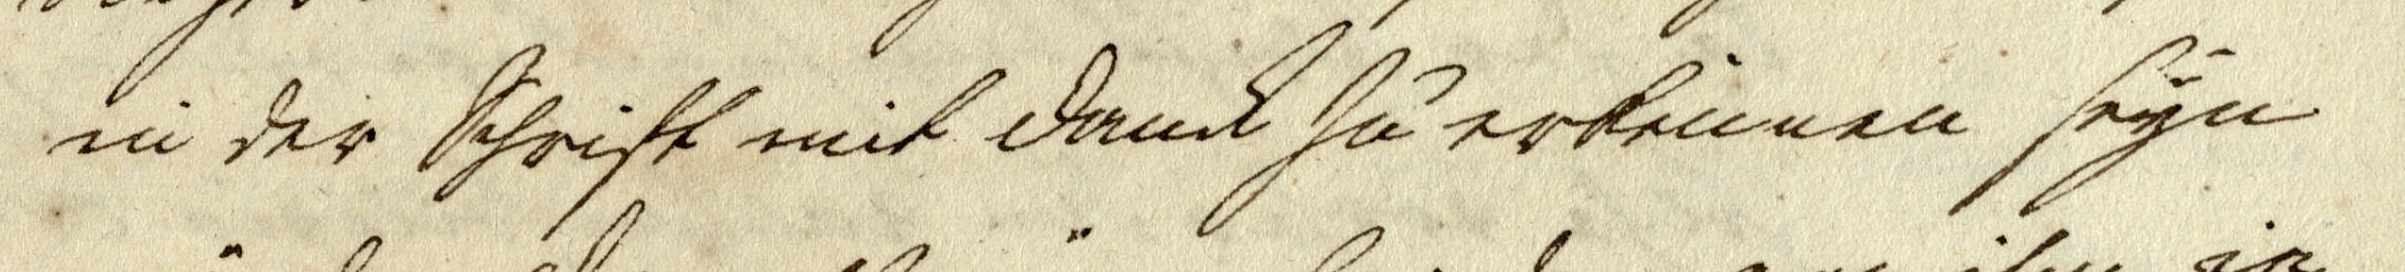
in der Schrift mit Danck zu erkennen seÿn
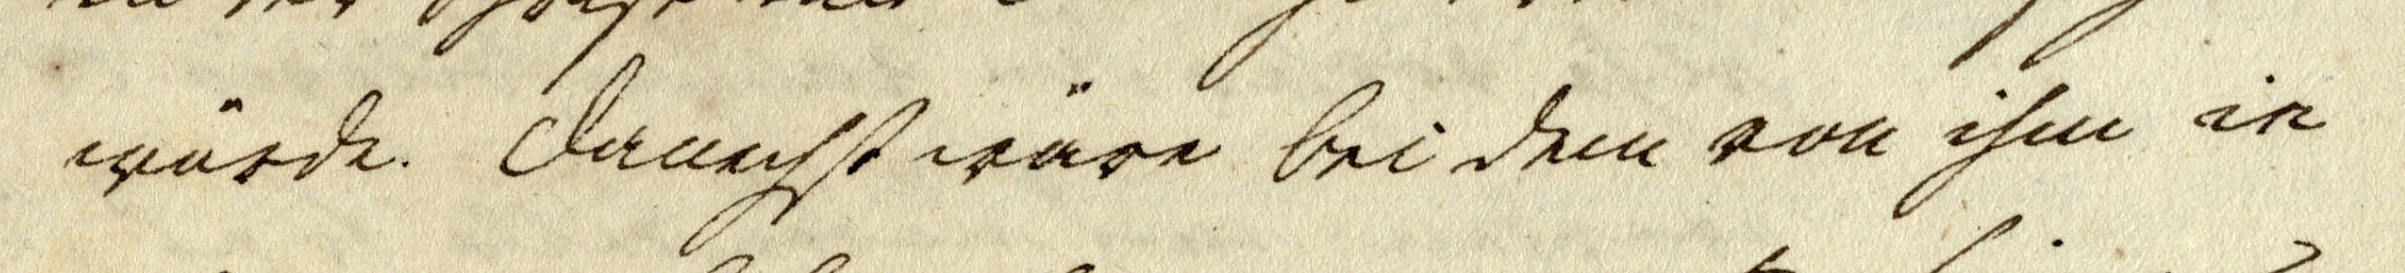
würde. Danechst wäre bei dem von ihm in
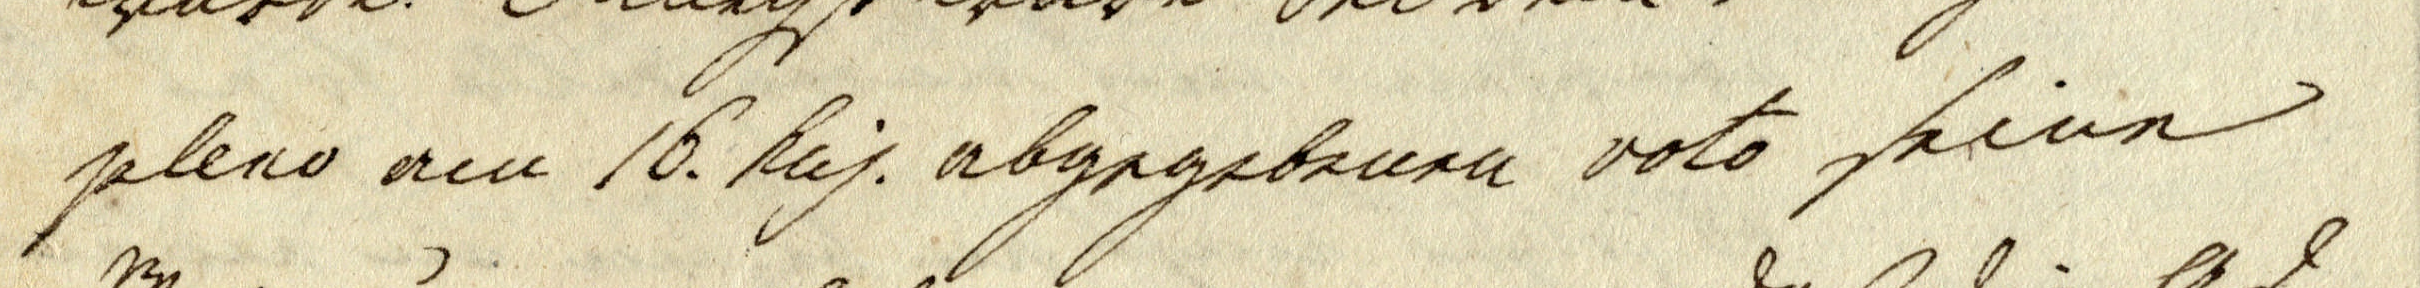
pleno am 13. huj. abgegebenen voto seine
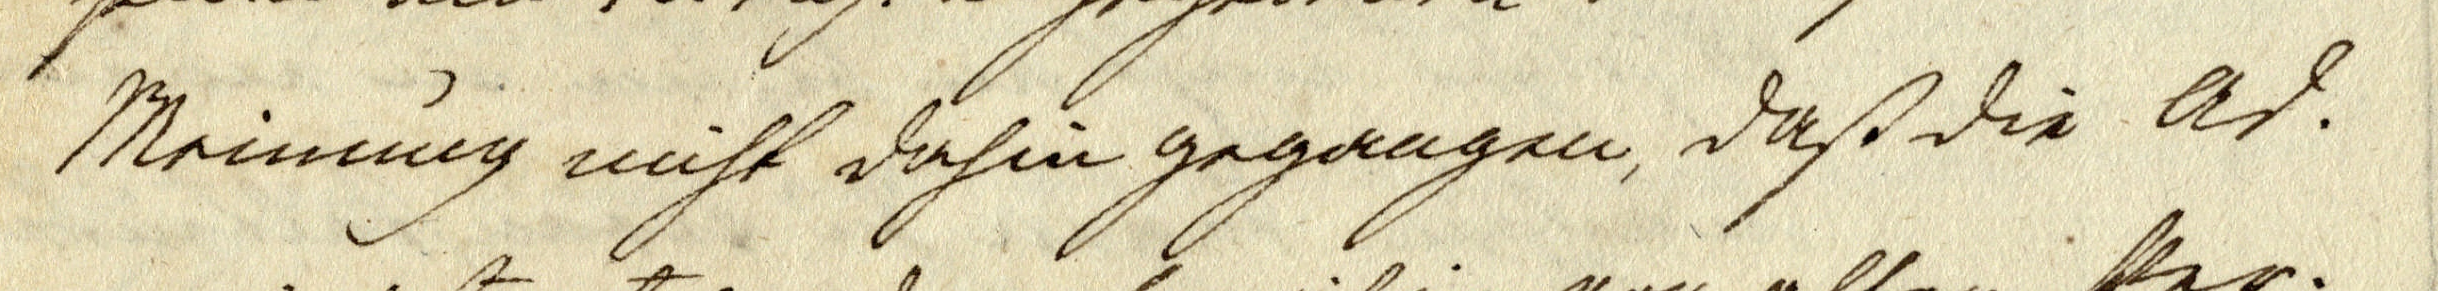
Meinung nicht dahin gegangen, daß die Ad¬
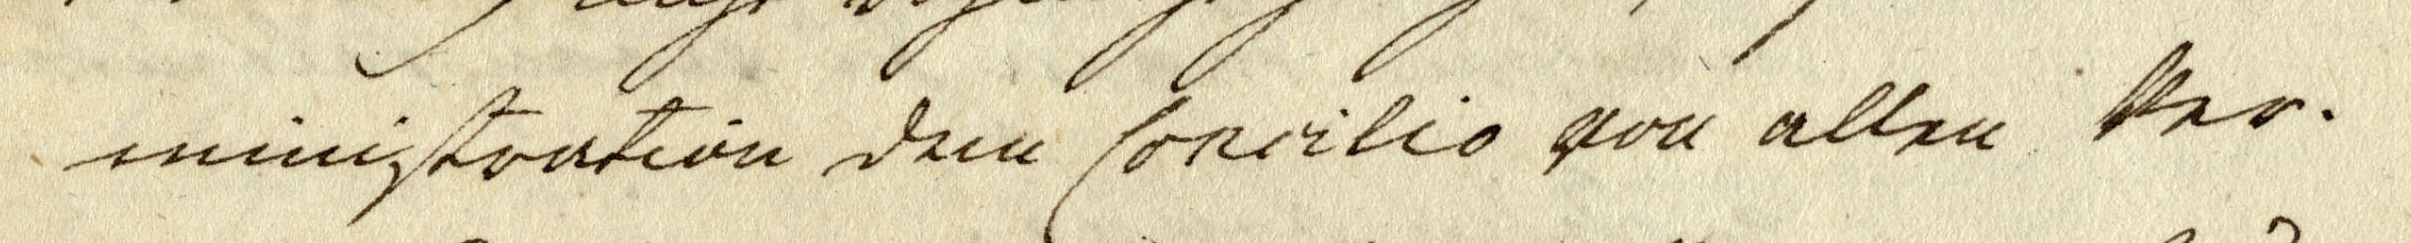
ministration dem Concilio von allen Ver¬
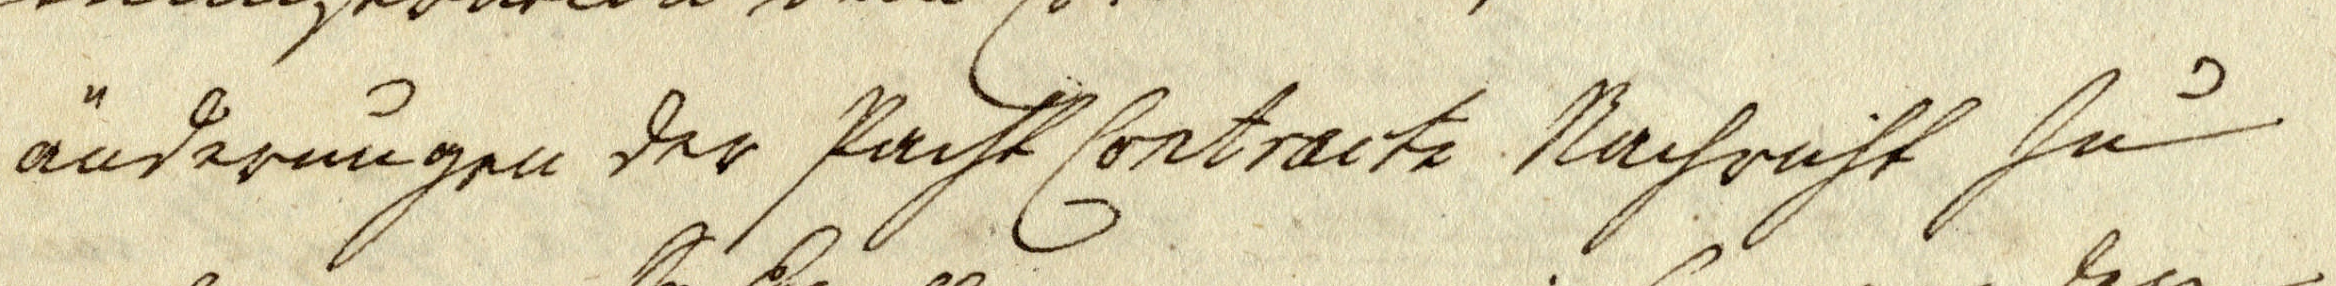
änderungen der Pacht Contracte Nachricht zu
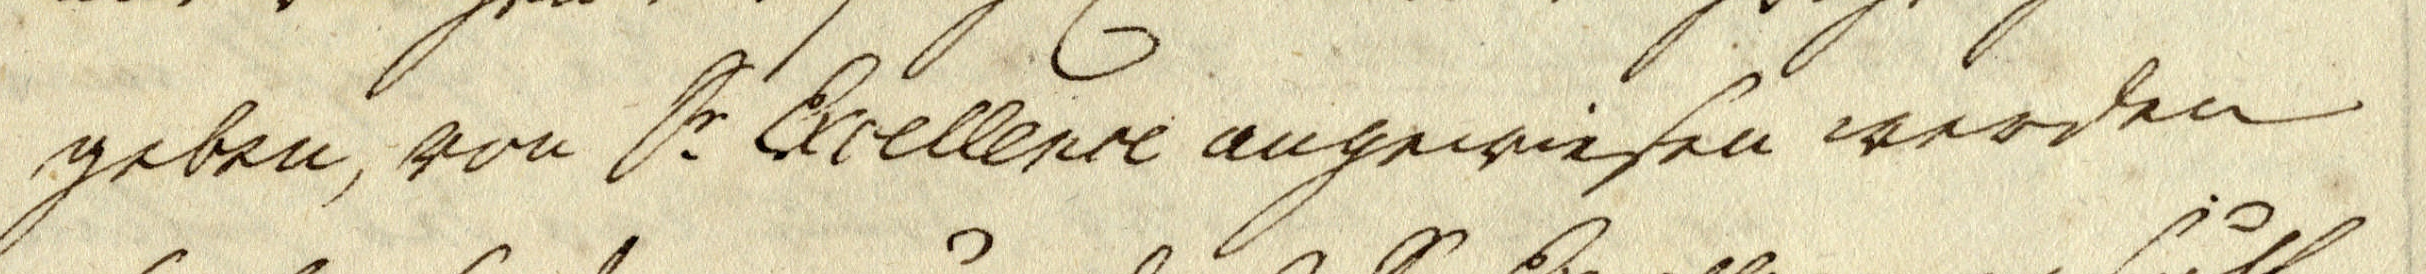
geben, von Sr Excellence angewiesen werden
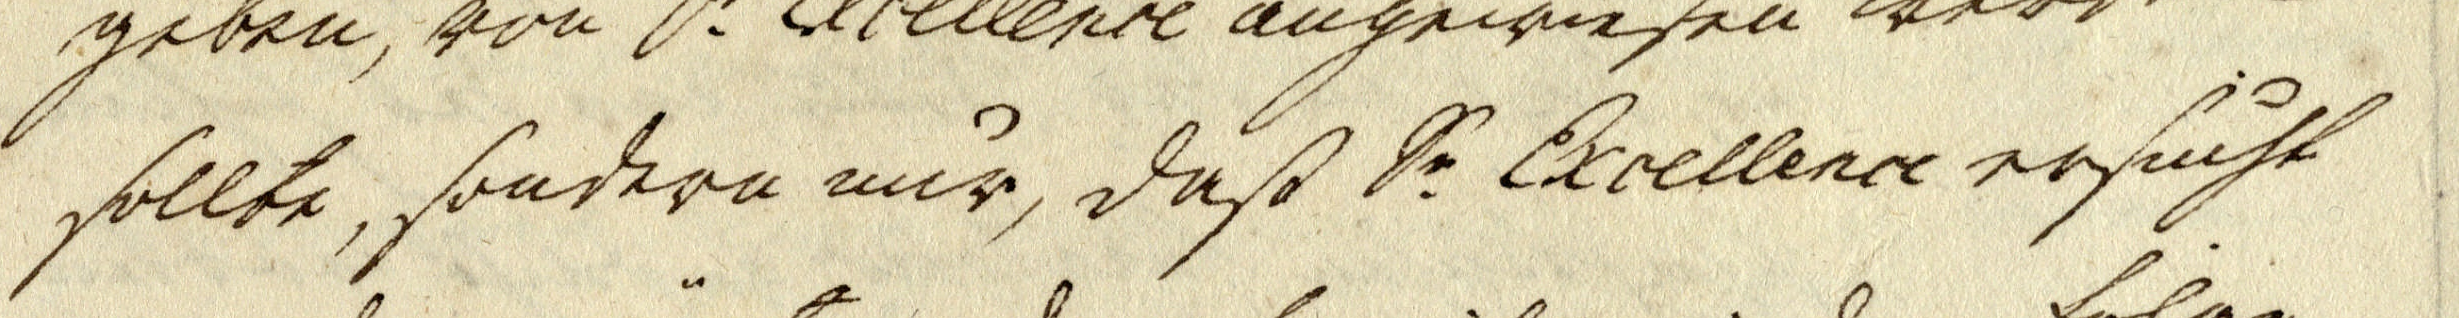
sollte, sondern nur, daß Sr Excellence ersucht
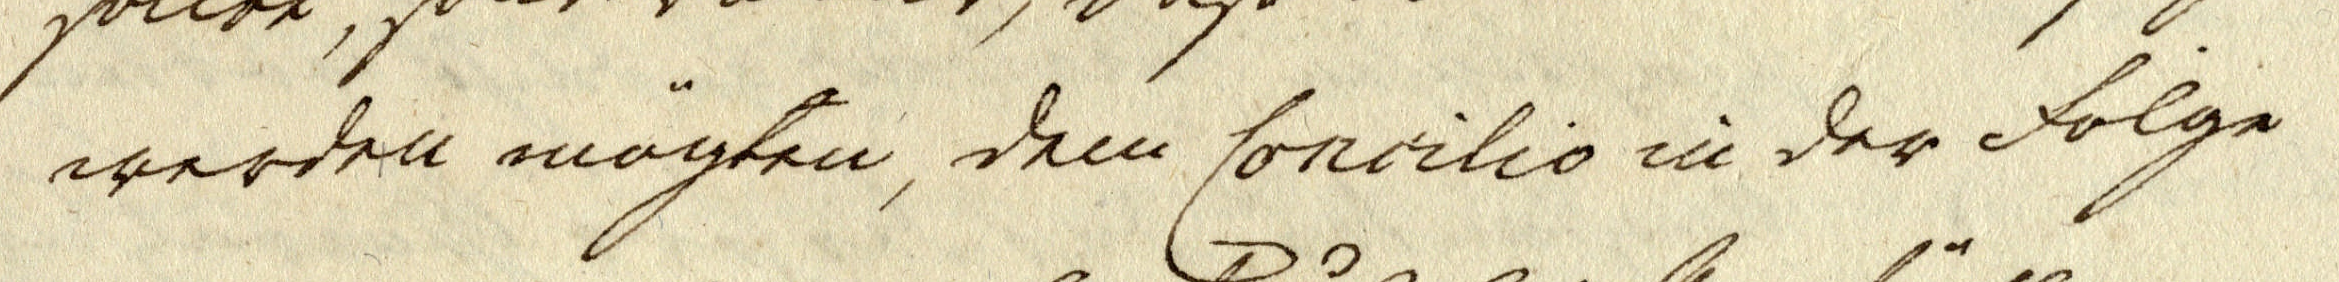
werden mögten, dem Concilio in der Folge
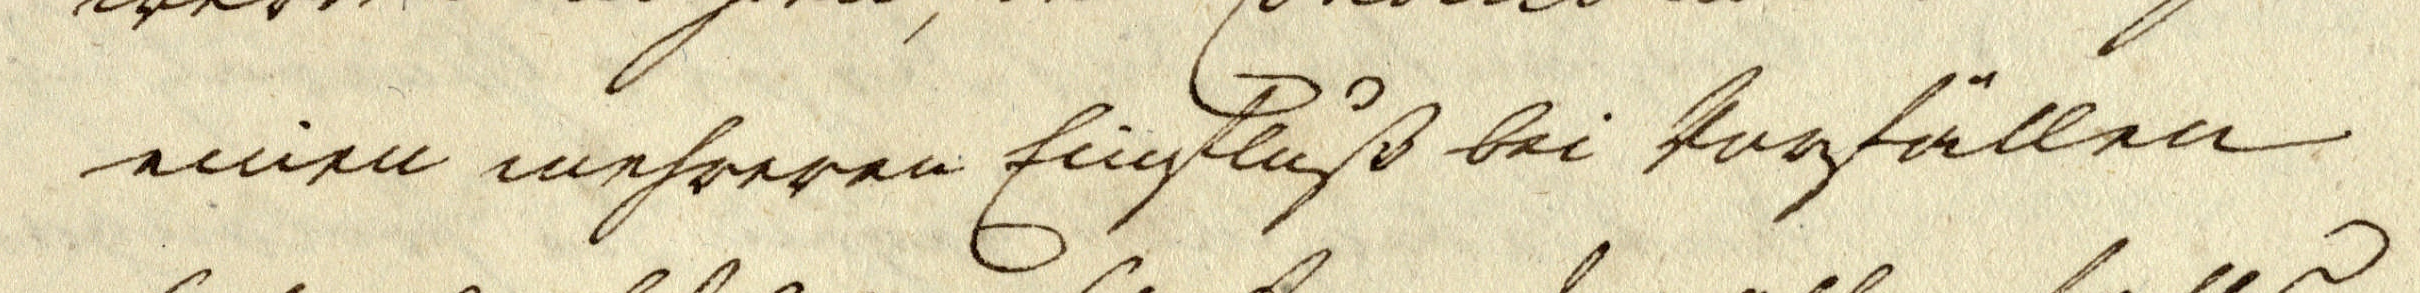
einen mehreren Einfluß bei Vorfällen
